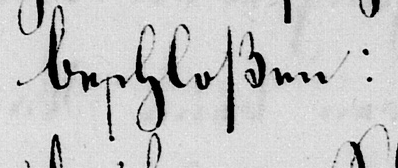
beschloßen:
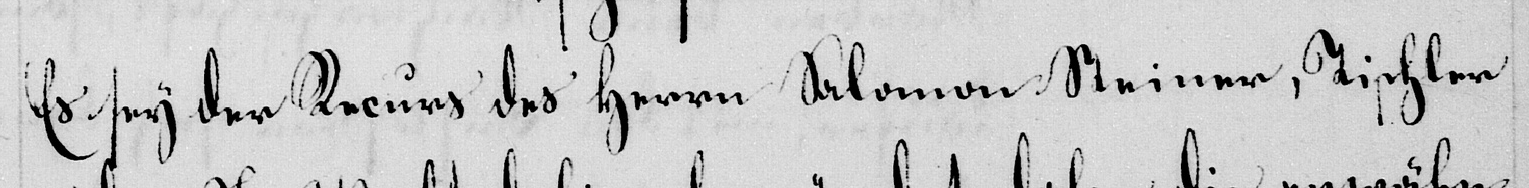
Es sey der Recurs des Herrn Salomon Steiner, Tischler
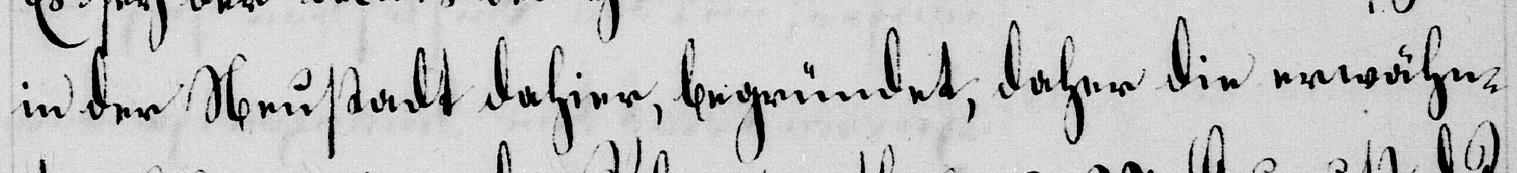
in der Neustadt dahier, begründet, daher die erwähn¬
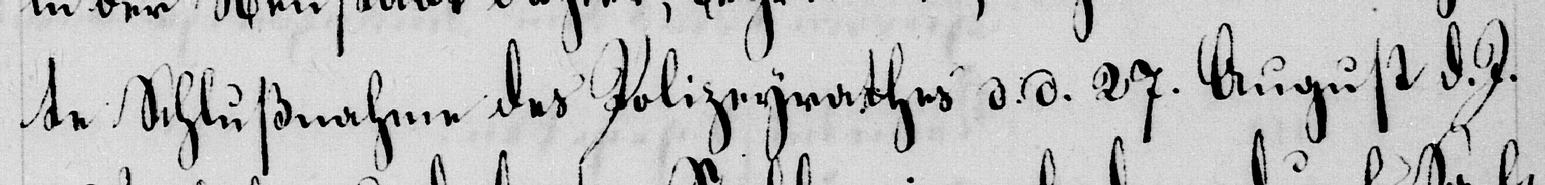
te Schlußnahme des Polizeyrathes d. d. 27. August d. J.
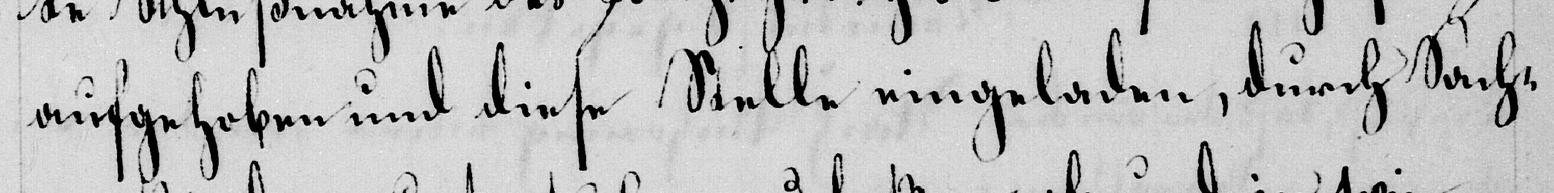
aufgehoben und diese Stelle eingeladen, durch Sach¬
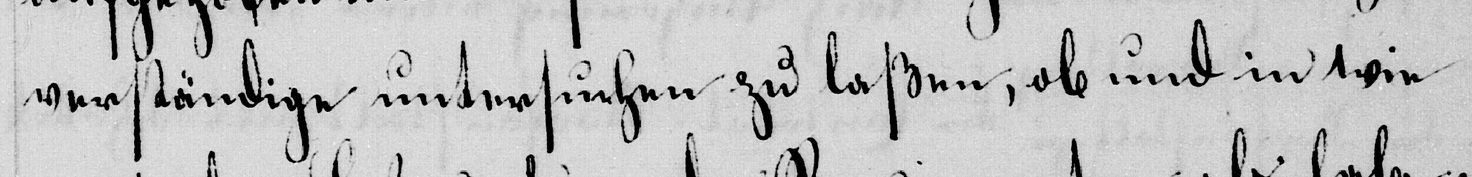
verständige untersuchen zu laßen, ob und in wie
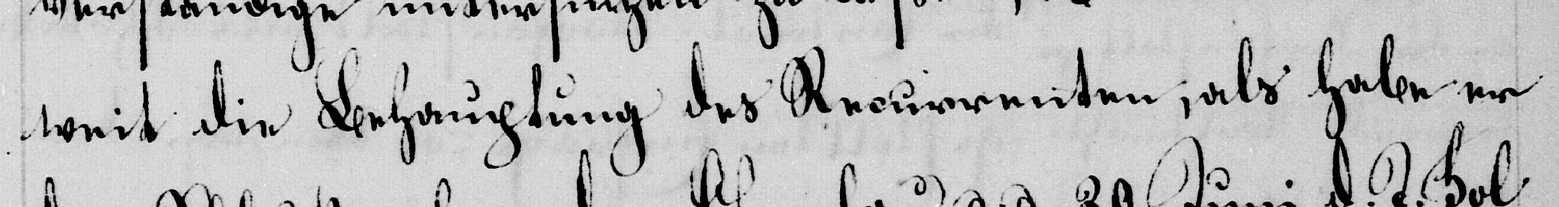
weit die Behauptung des Recurrenten, als habe er
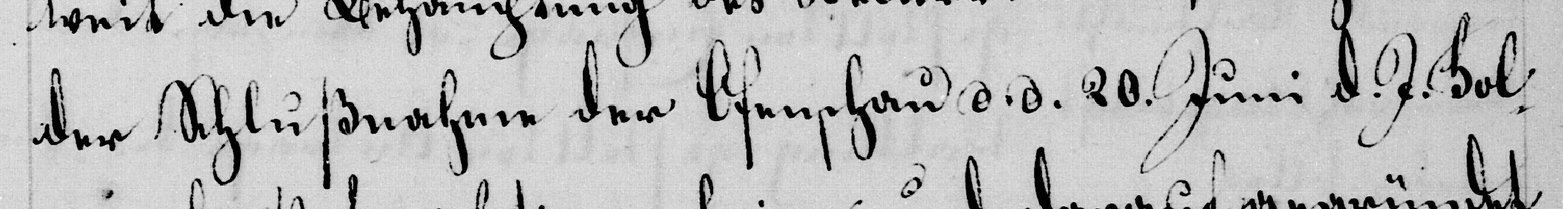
der Schlußnahme der Ofenschau d. d. 20. Juni d. J. Fol¬
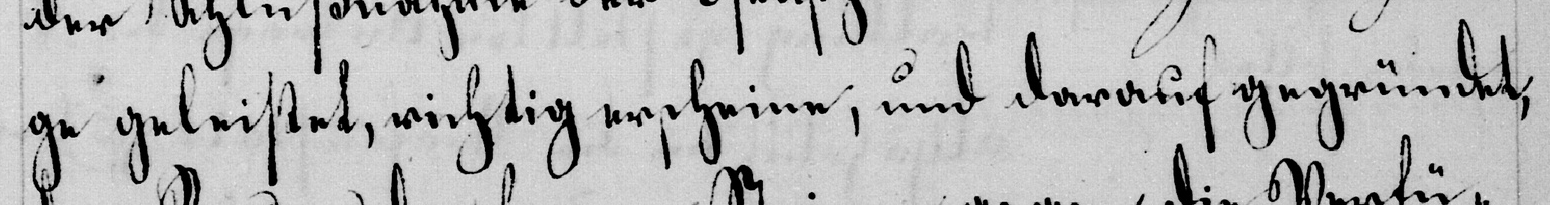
ge geleistet, richtig erscheine, und darauf gegründet,
